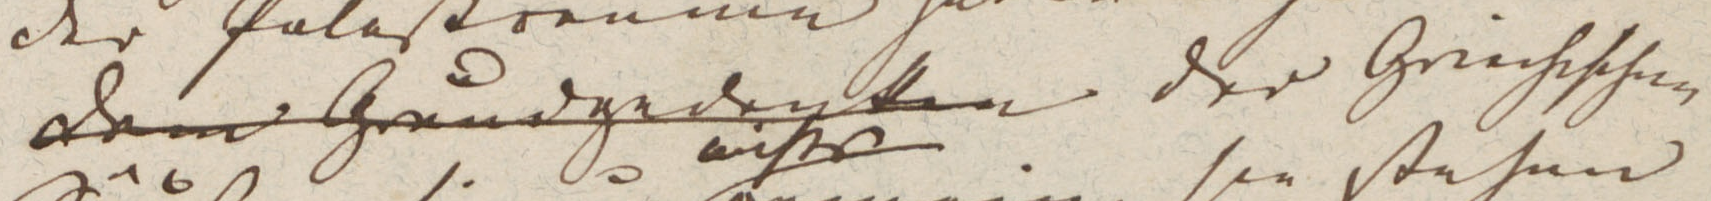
dem Grundgedanken der Griechischen
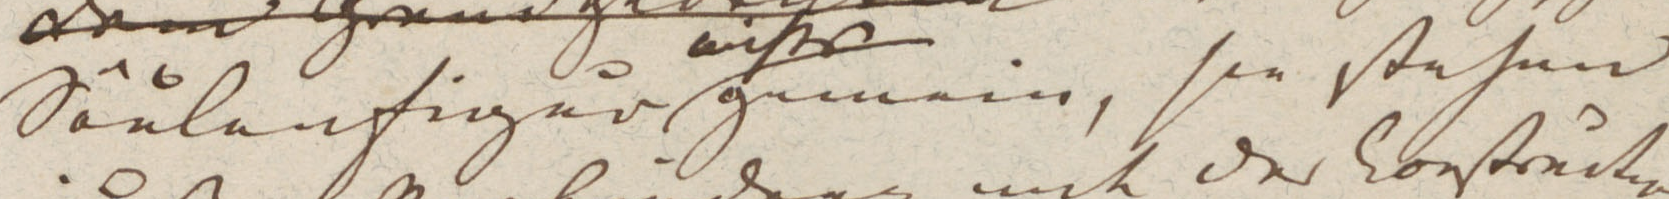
Säulenfigur nichts gemein, sie stehen
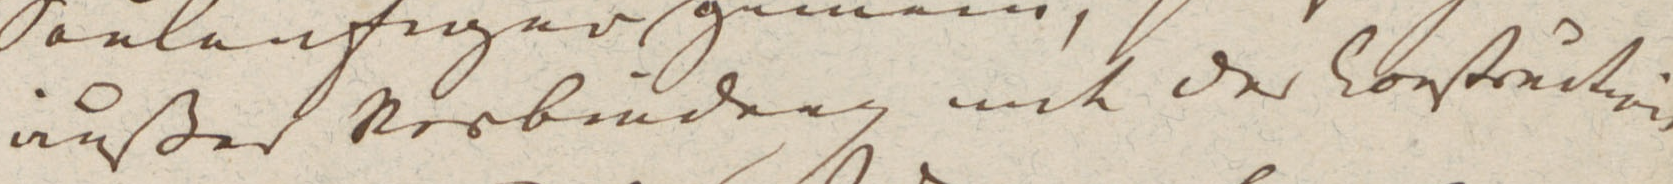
ausser Verbindung mit der Construction
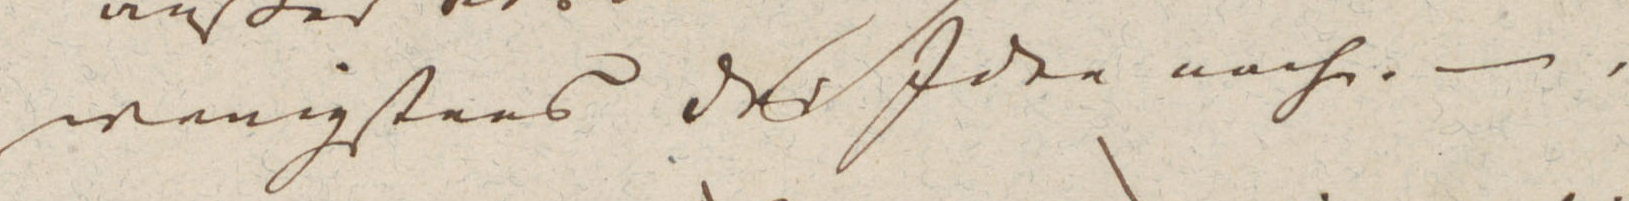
wenigstens der Idee nach. – .
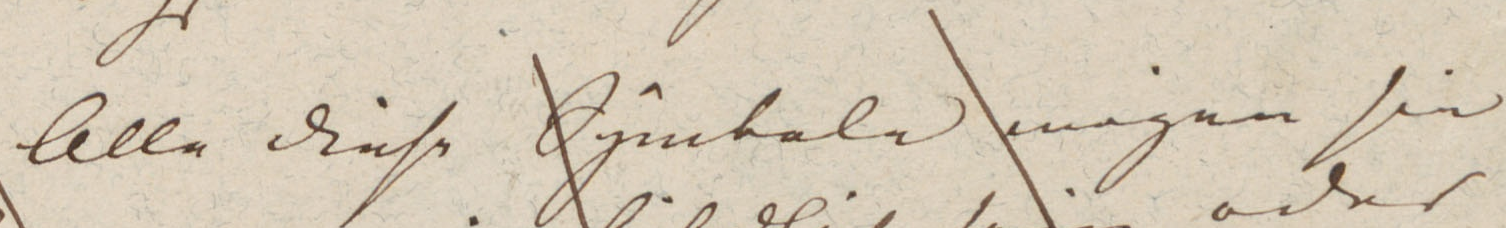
Alle diese Symbole mögen sie
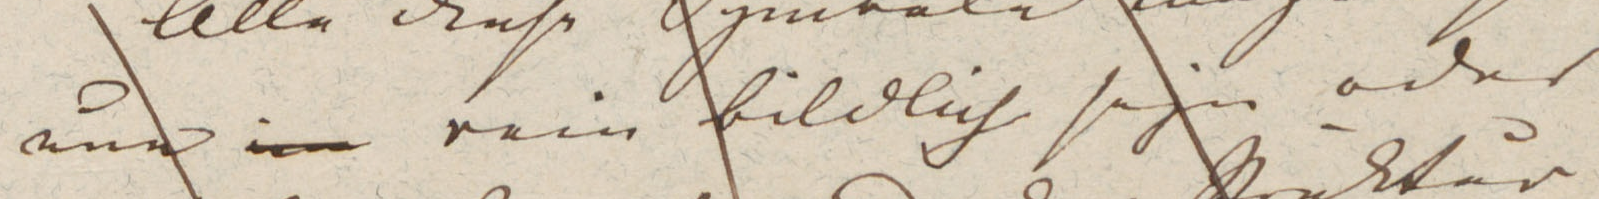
nun im rein bildlich seyn oder
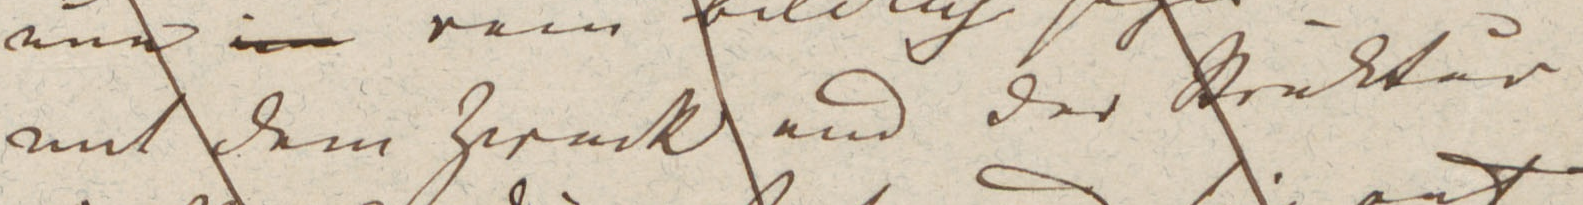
mit dem Zweck und der Struktur
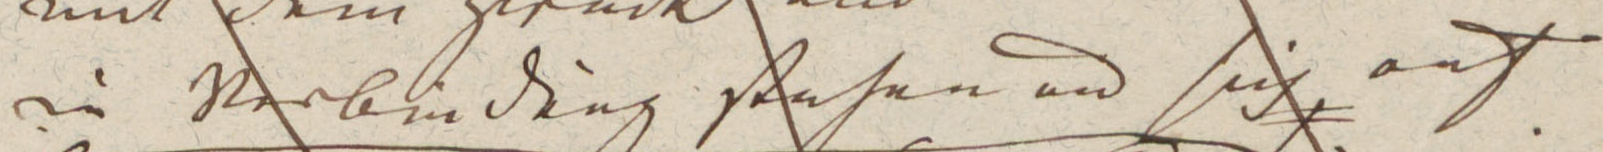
in Verbindung stehen und sich auf
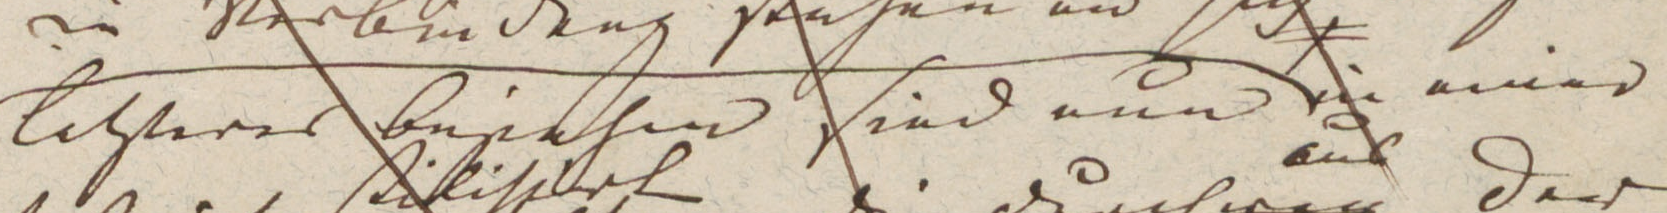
letzteres beziehen sind nun % in einer
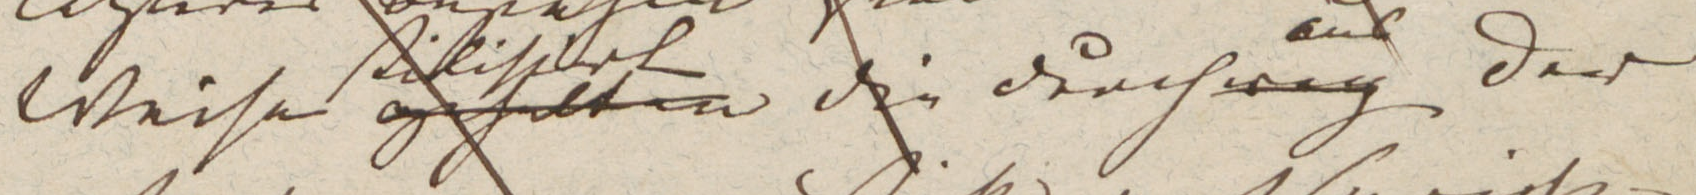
Weise gehalten stilisirt die durchwegaus der
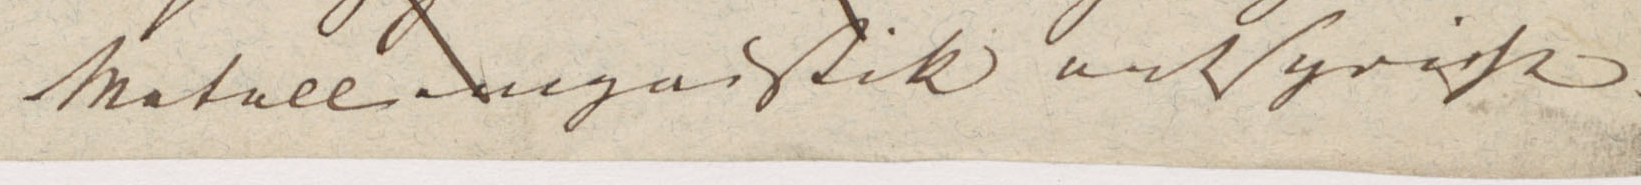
Metallempaistik entspricht.
